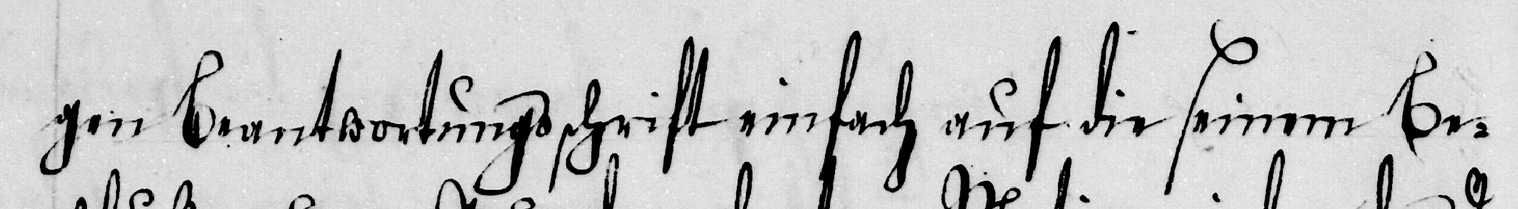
gen Beantwortungsschrift einfach auf die seinem Be¬
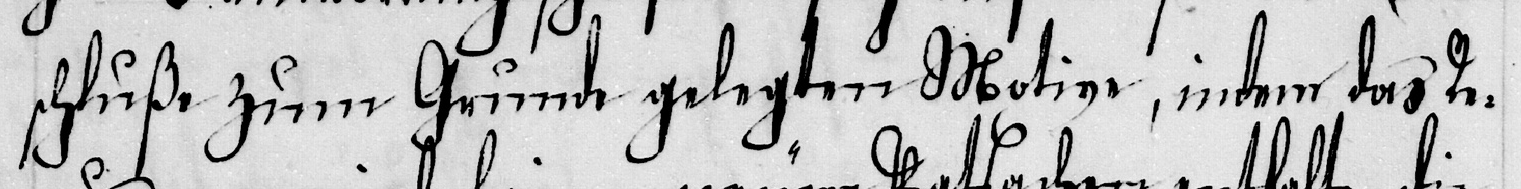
schluße zum Grunde gelegten Motive, indem das Re¬
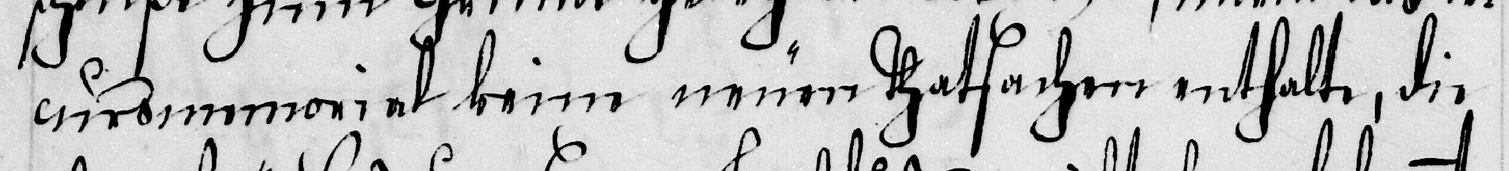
cursmemorial keine neuen Thatsachen enthalte, die
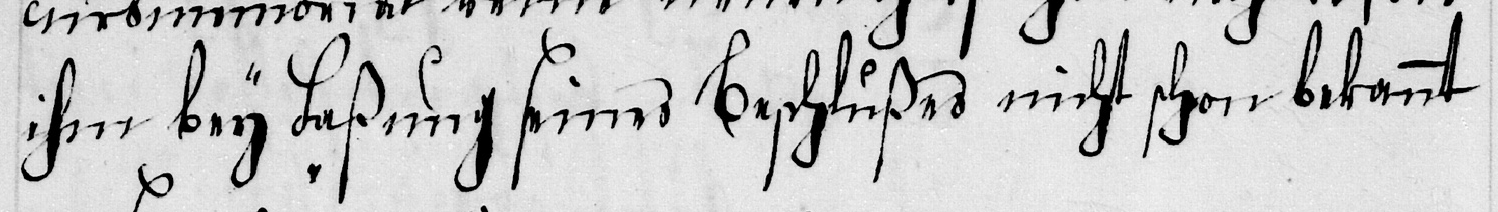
ihm bey Faßung seines Beschlußes nicht schon bekannt
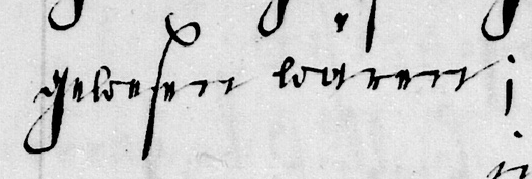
gewesen wären;
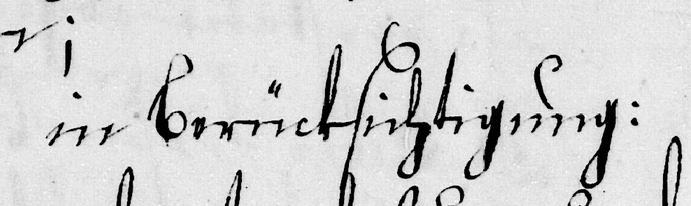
in Berücksichtiung:
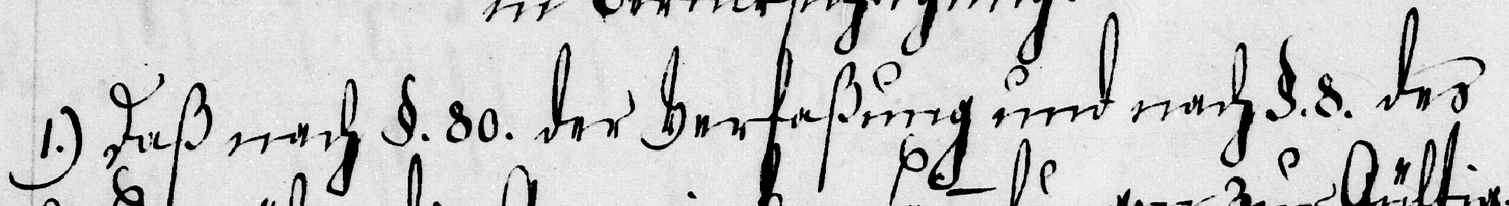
1.) Daß nach §. 80. der Verfaßung und nach §. 8. des
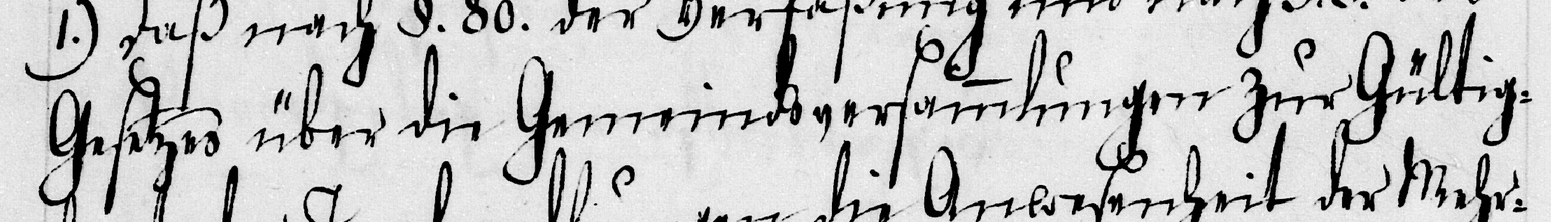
Gesetzes über die Gemeindsversammlungen zur Gültig¬
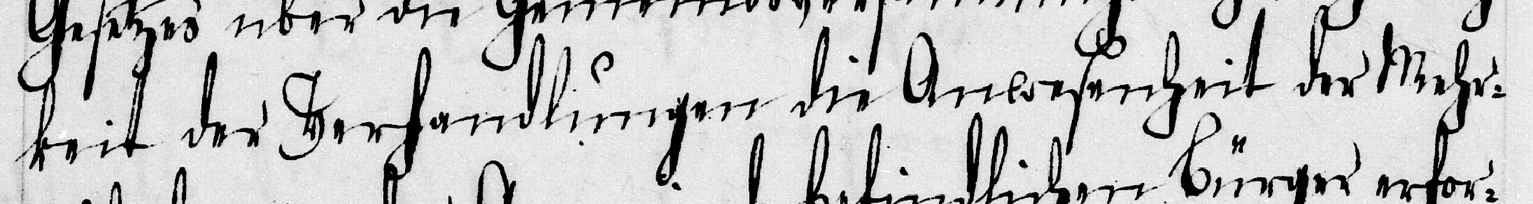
keit der Verhandlungen die Anwesenheit der Mehr¬
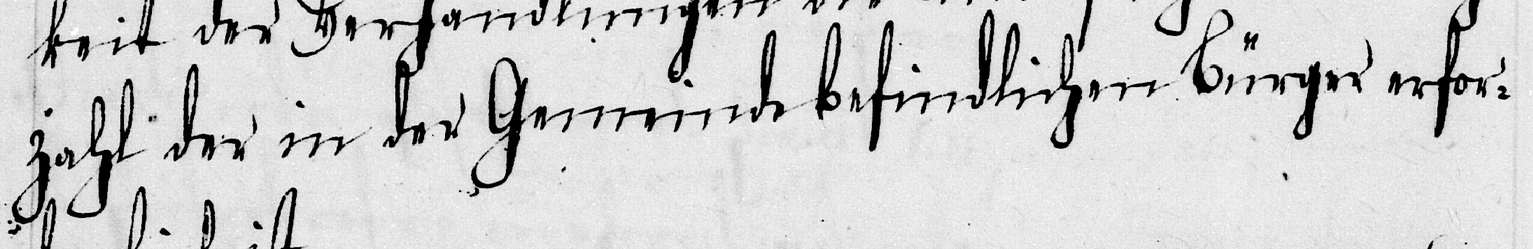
zahl der in der Gemeinde befindlichen Bürger erfor¬
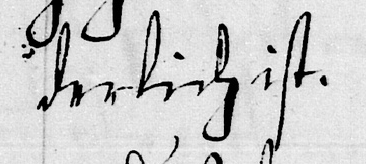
derlich ist.
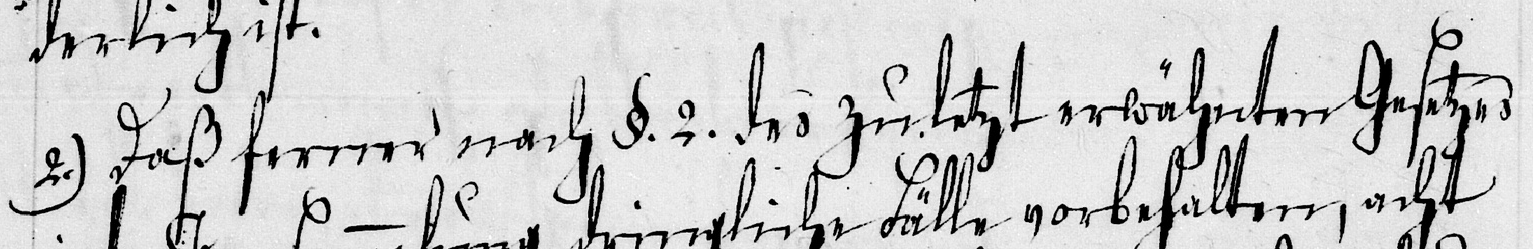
2.) Daß ferner nach §. 2. des zuletzt erwähnten Gesetzes
